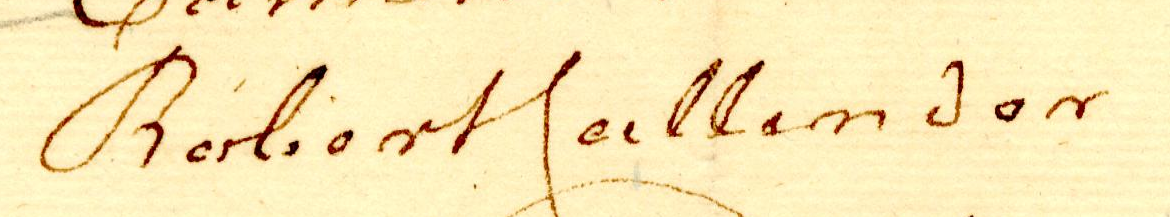Roberrt Callendor
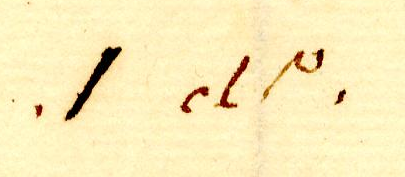1 d^o.
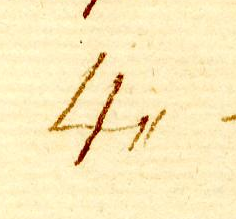4..
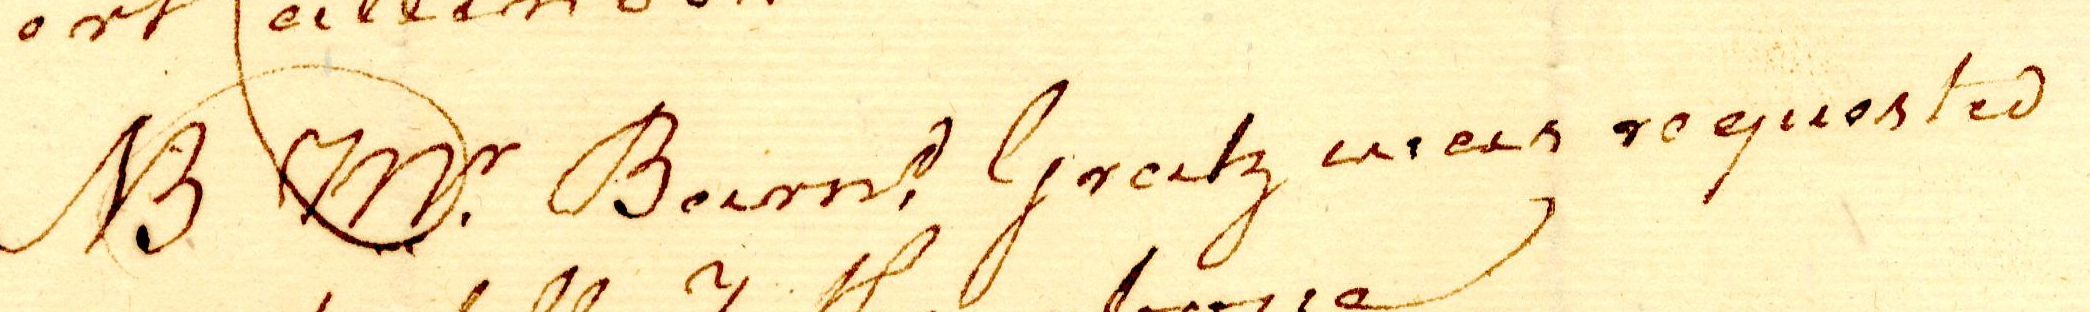NB M^r. Barn^d Gratz was requested
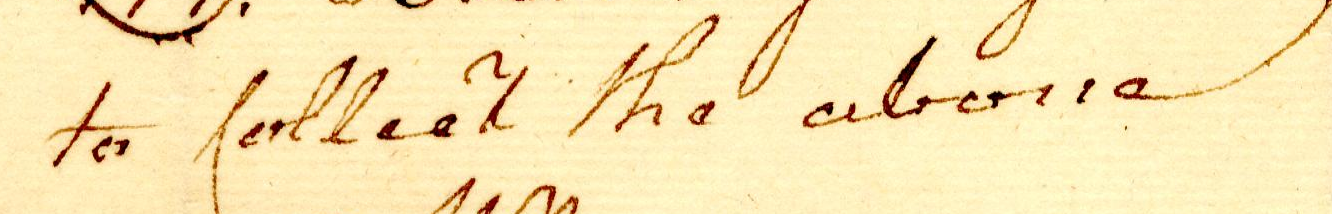to Collect the above
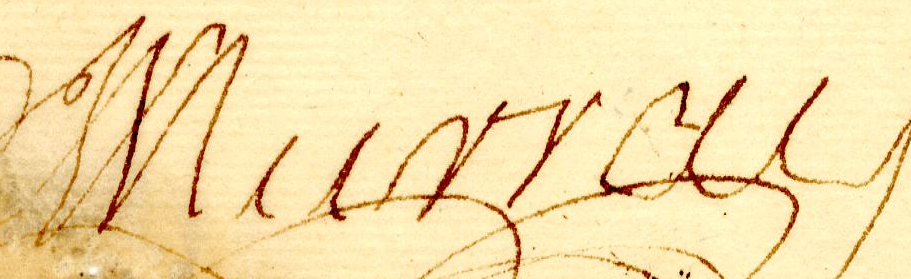Murray
